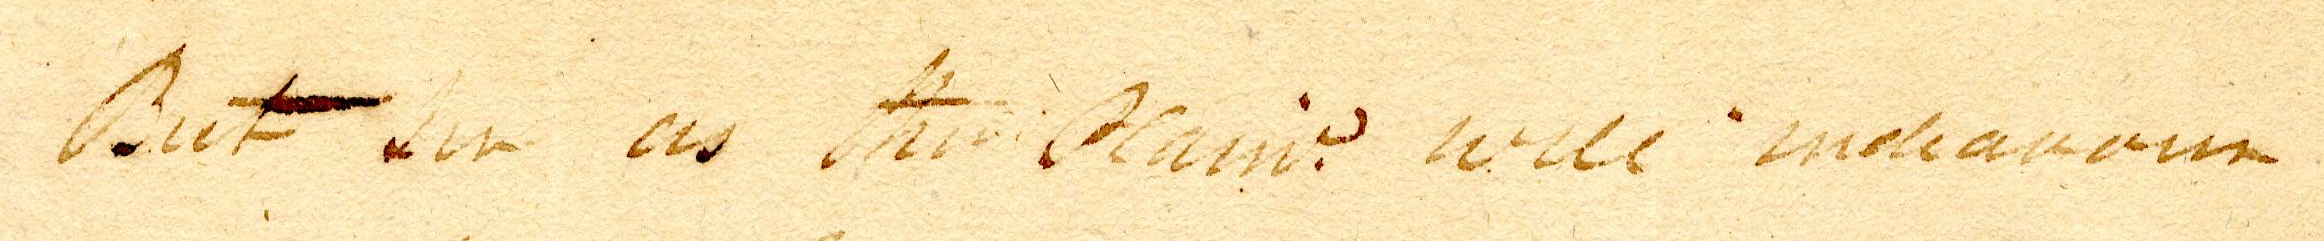But Sir as the Plain^e: will endeavour
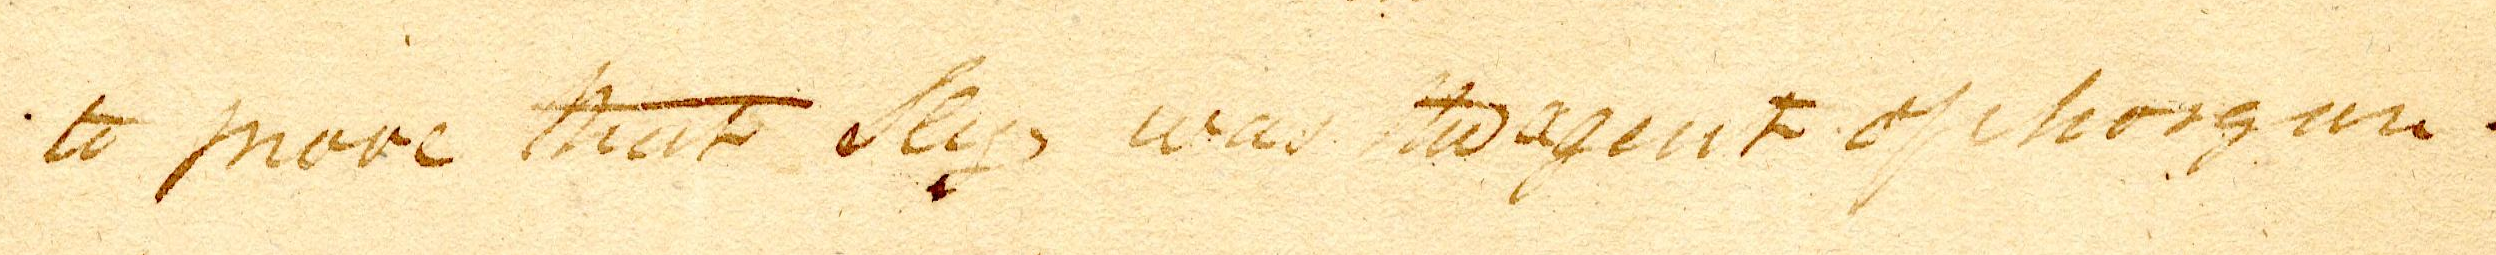to prove that Sly was the agent of Morgan
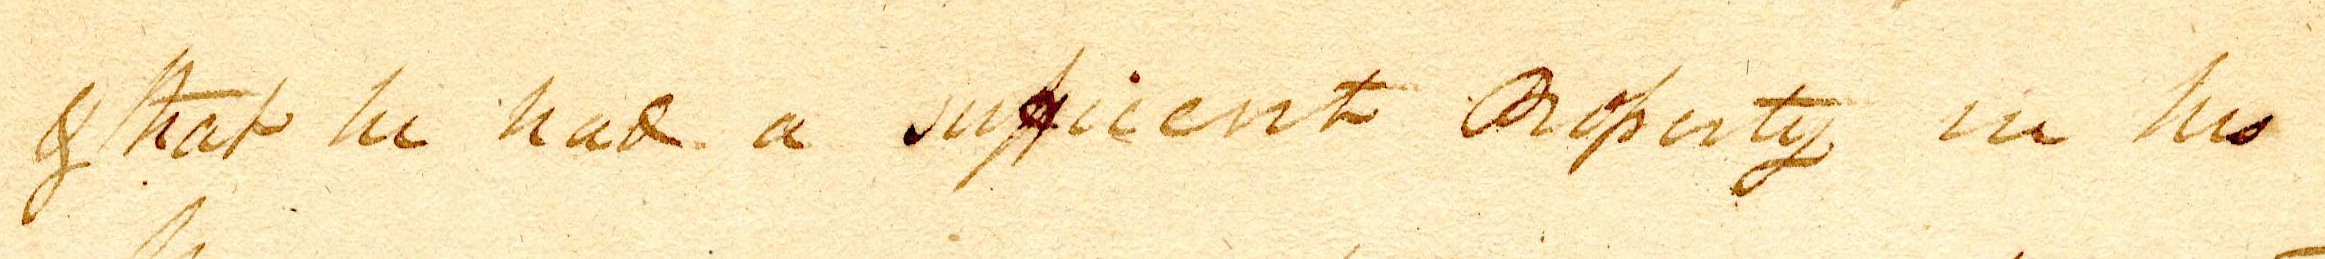& that he had a sufficent property in his
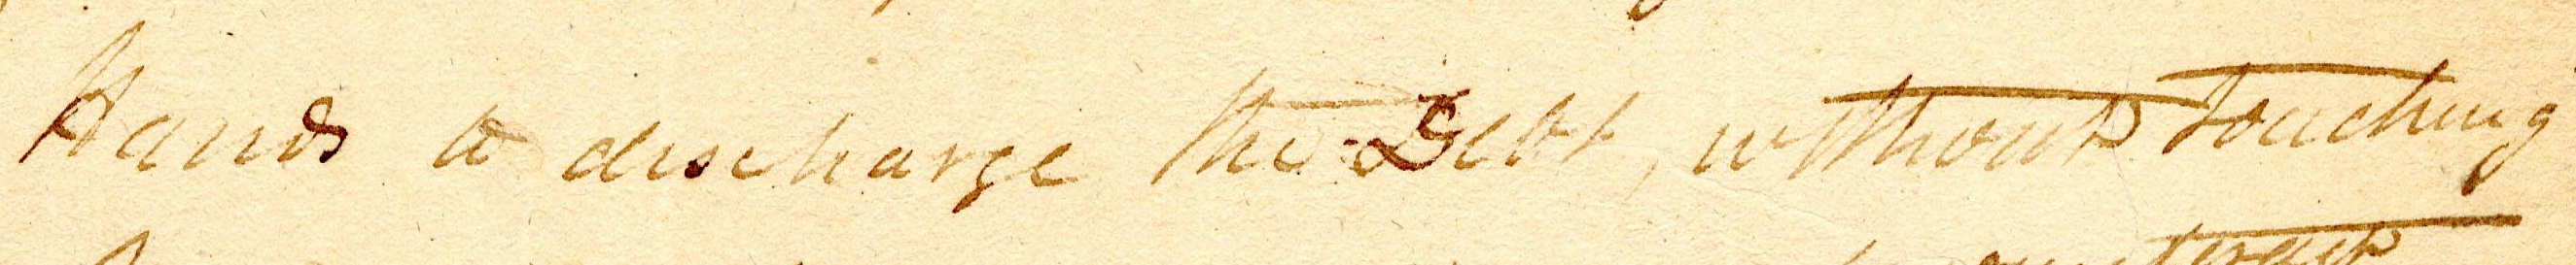Hands a discharge the Debt, without touching
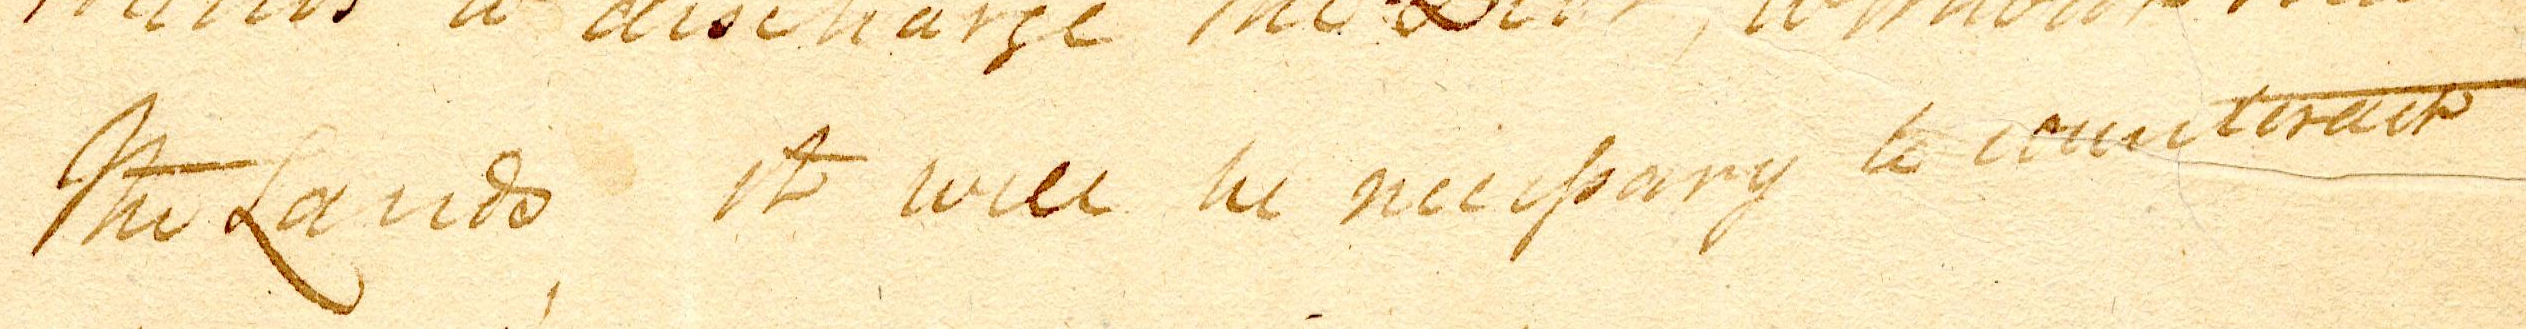The Lands it well be necessary to counteract
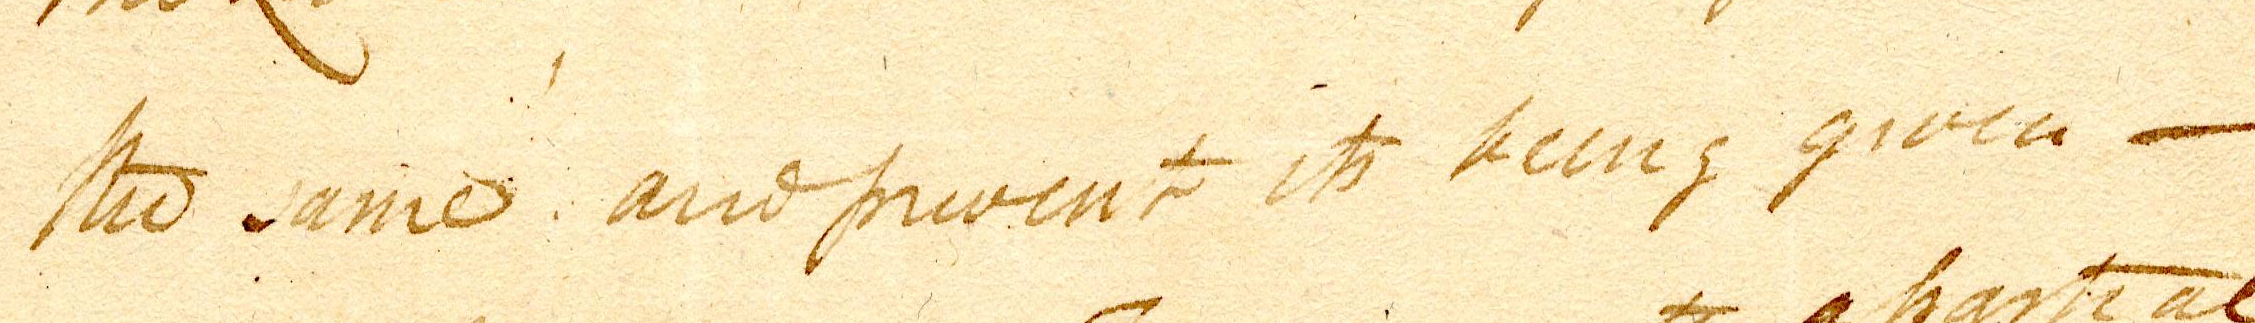the same and prevent it being given.
